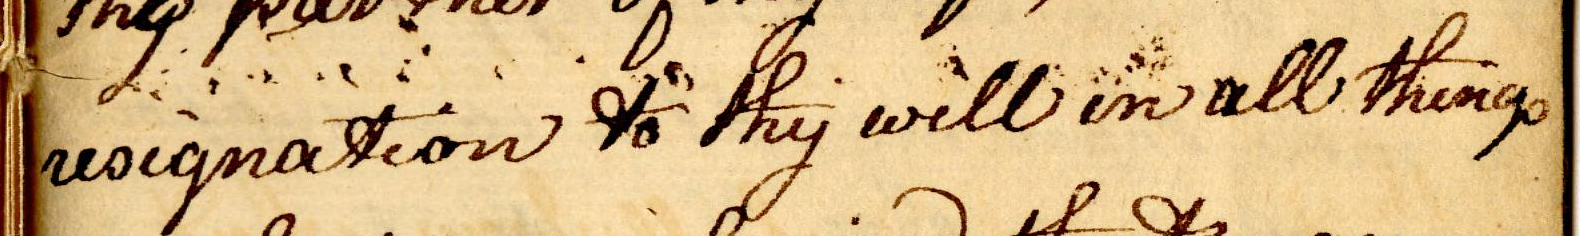resignation to thy will in all things
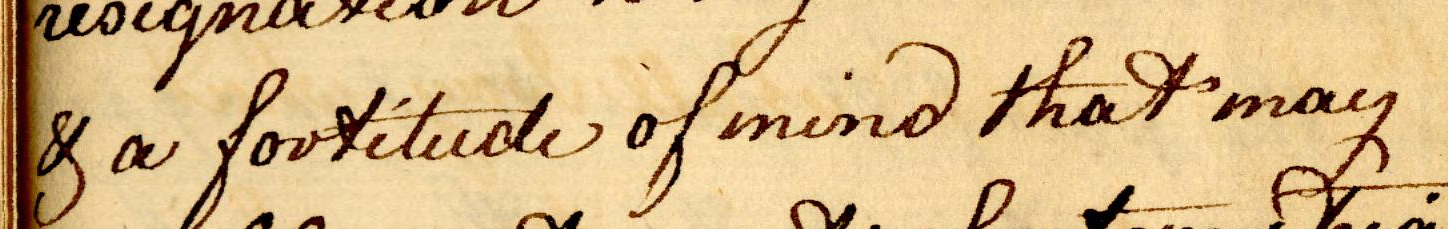& a fortitude of mind that may
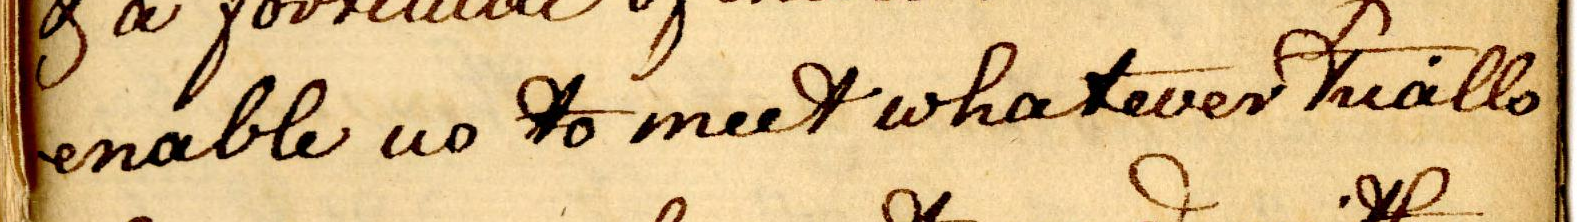enable us to meet whatever trialls
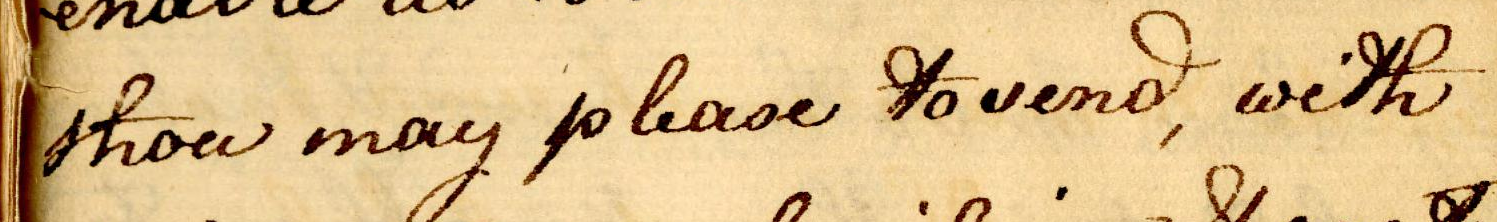thou may please to send, with
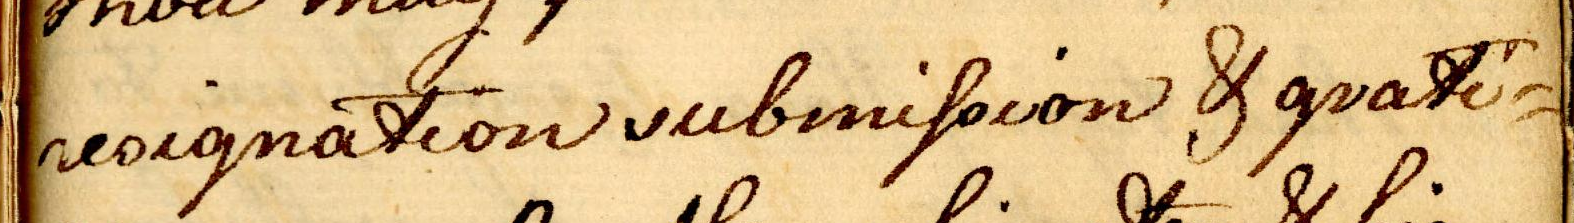resignation submission & grati-
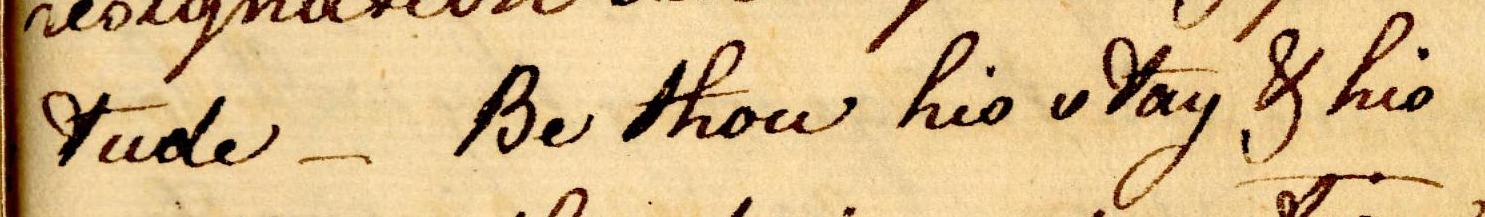tude- Be thou his stay & his
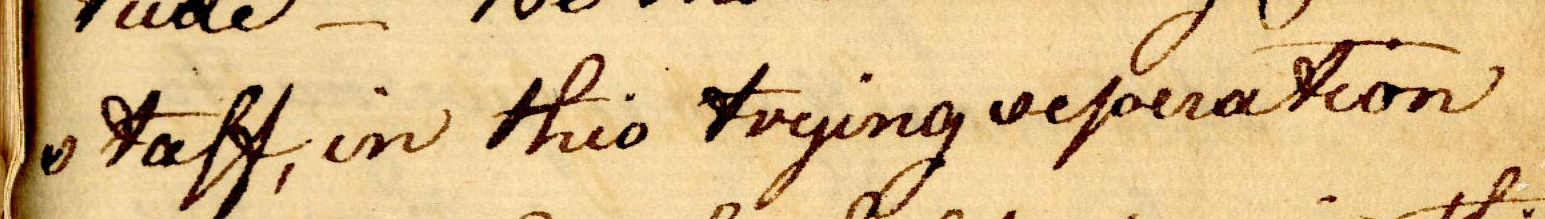staff, in this trying separation
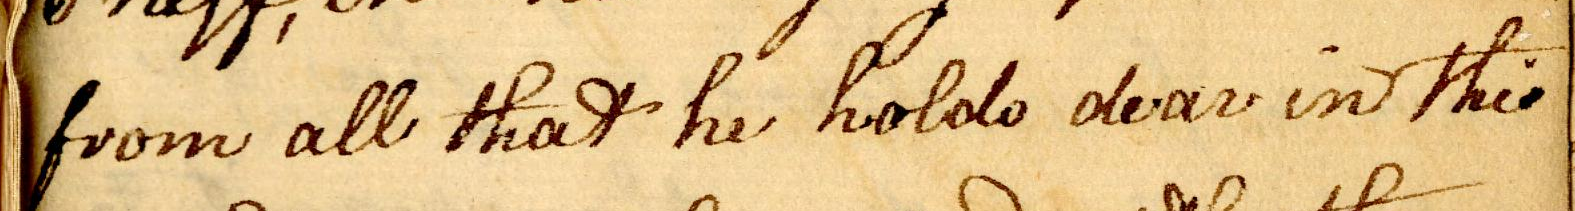from all that he holds dear in this
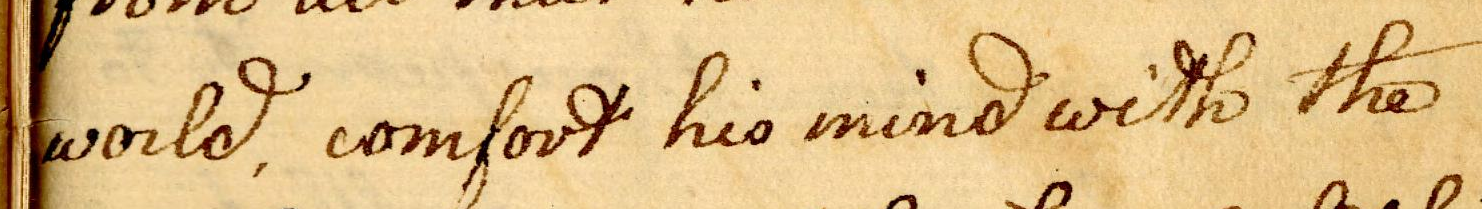world, comfort his mind with the
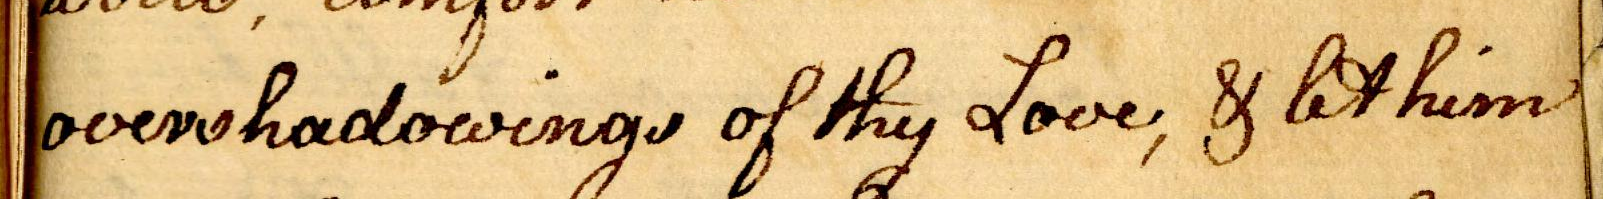overshadowings of thy Love, & let him
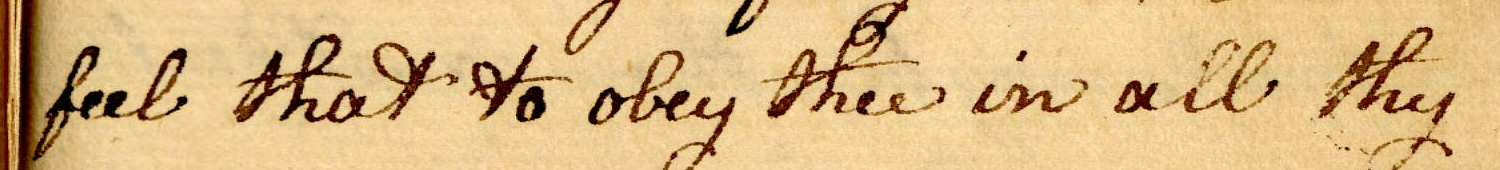feel that to obey thee in all thy
